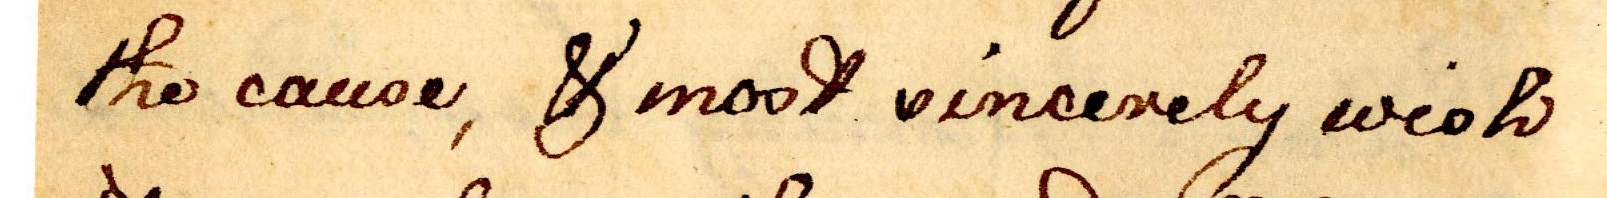the cause, & most sincerely wish
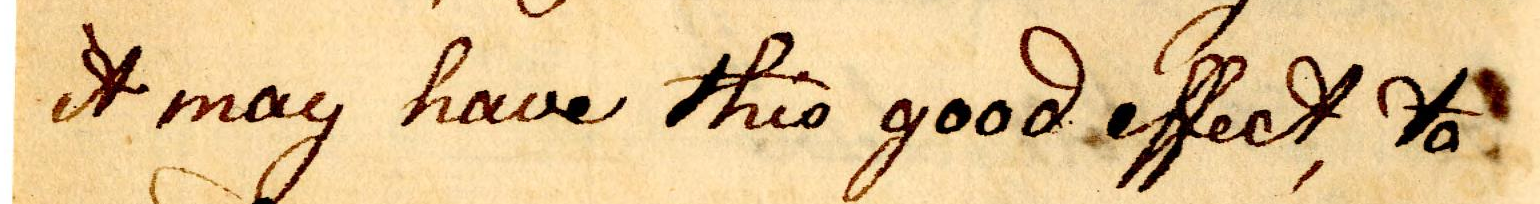it may have this good effect, to
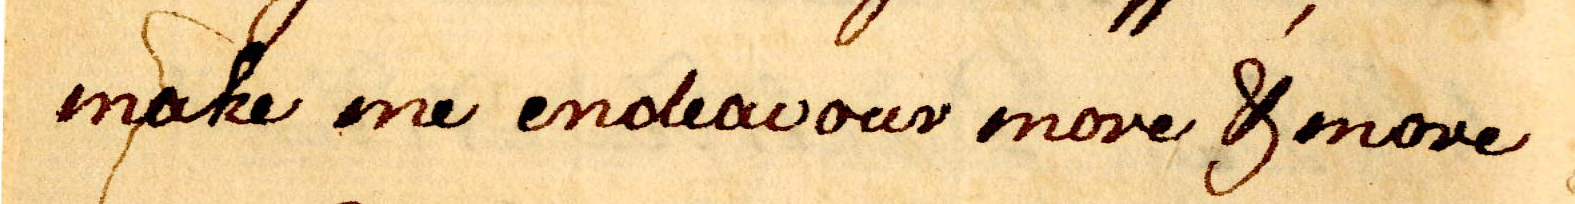make me endeavour more & more
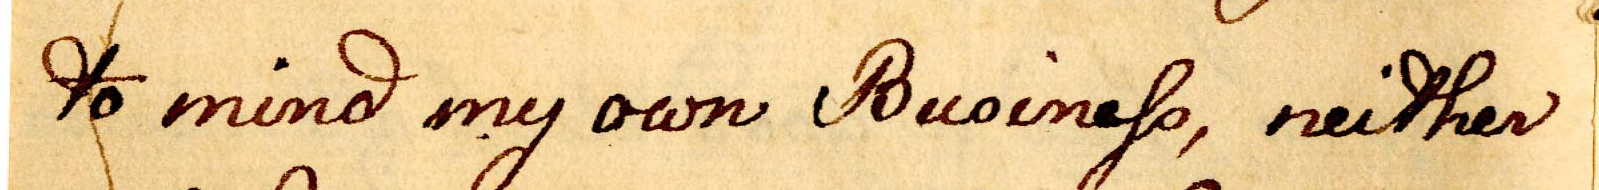to mind my own Business, neither
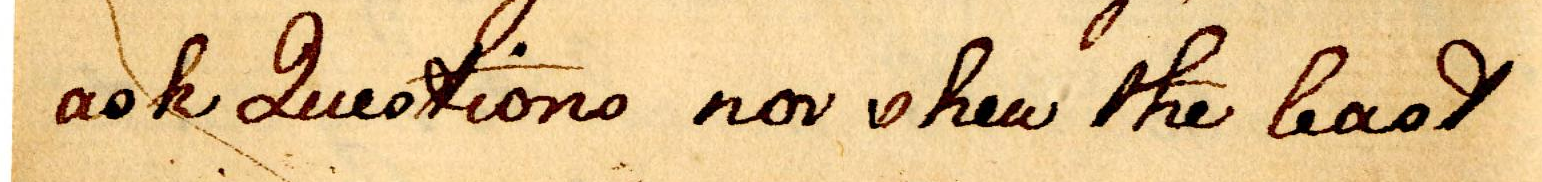ask Questions nor shew the least
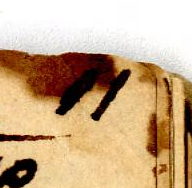11
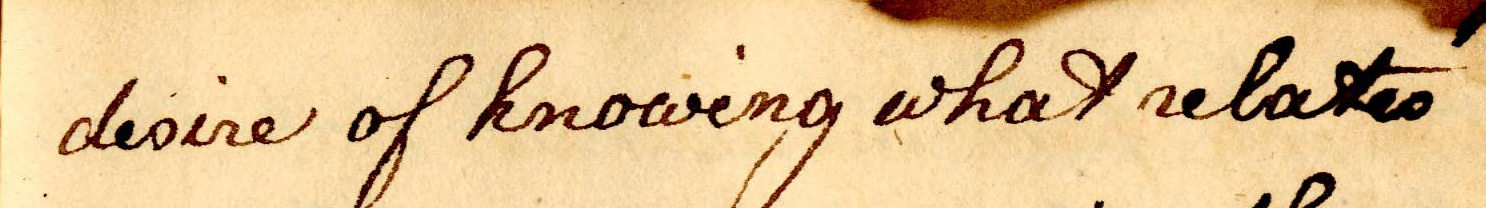desire of knowing what relates
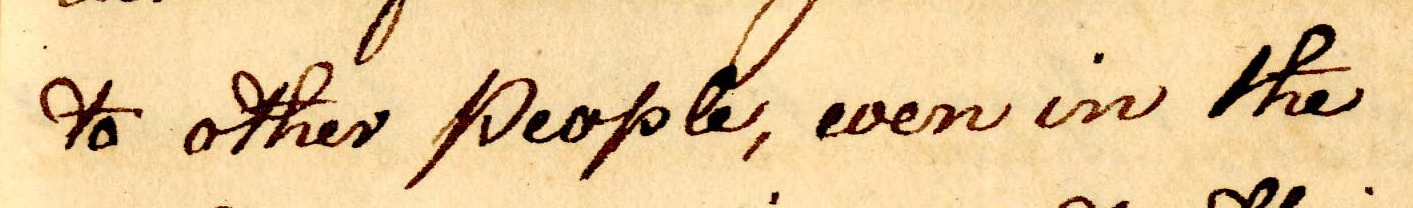to other People, even in the
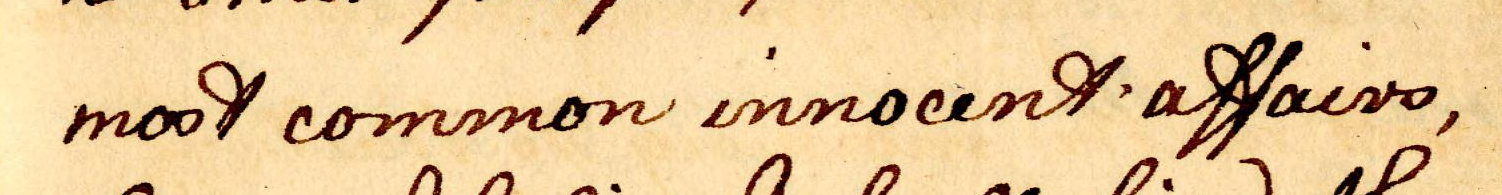most common innocent affairs,
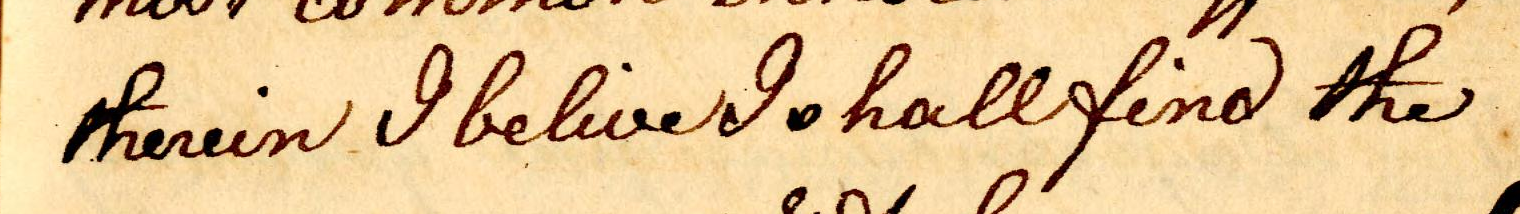therein I belive I shall find the
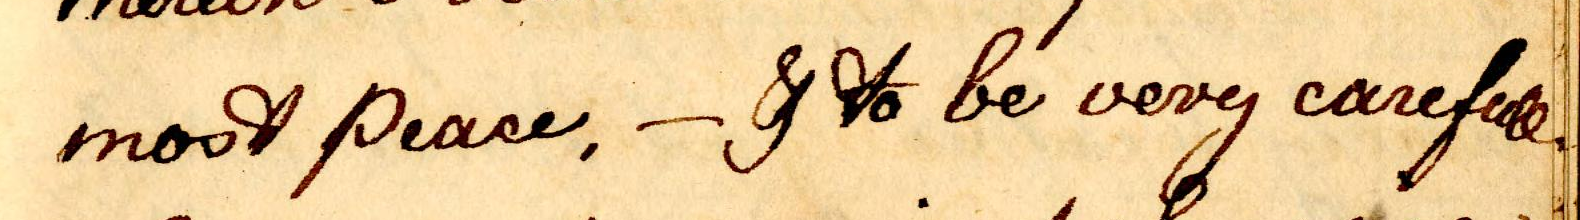most Peace,- & to be very carefull
